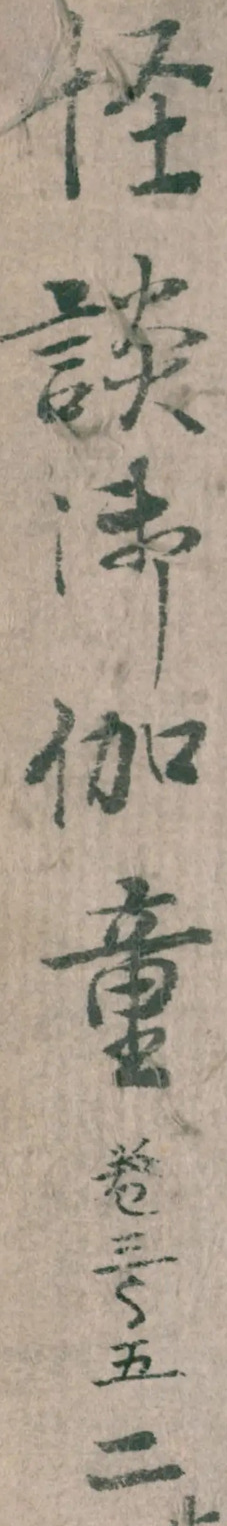怪談御伽童巻三〜五二止

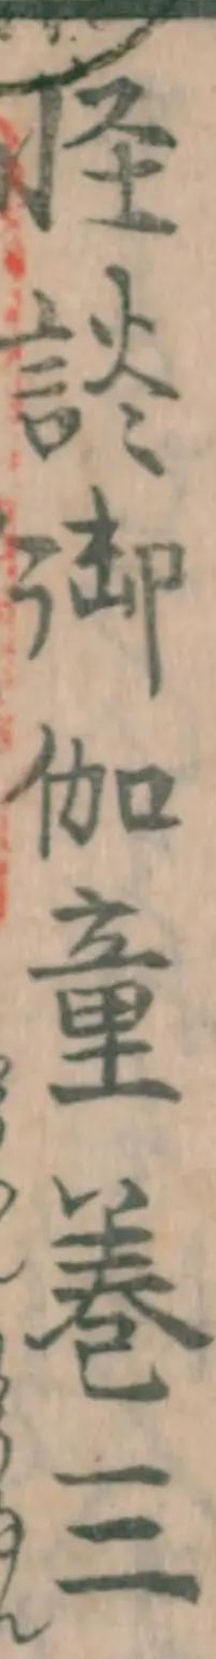怪談御伽童巻三
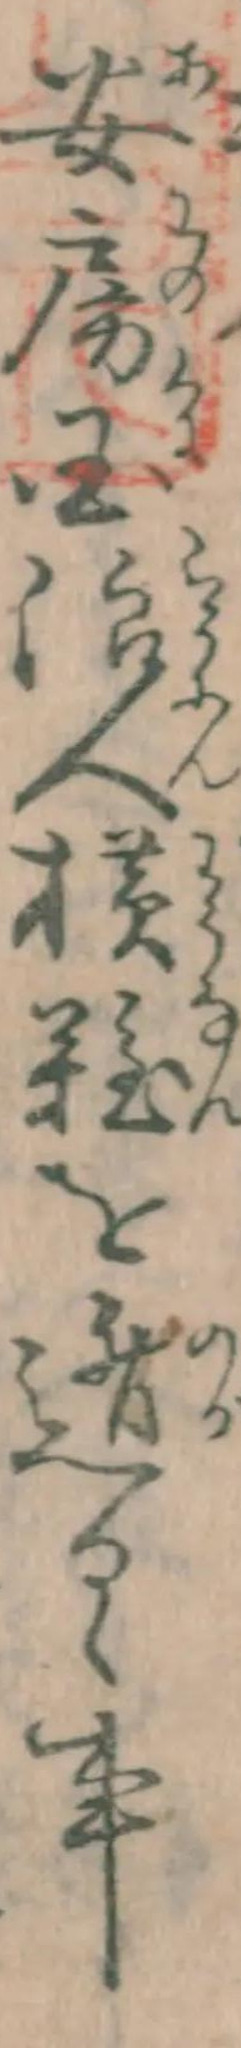安房国浪人横難を遁るゝ事
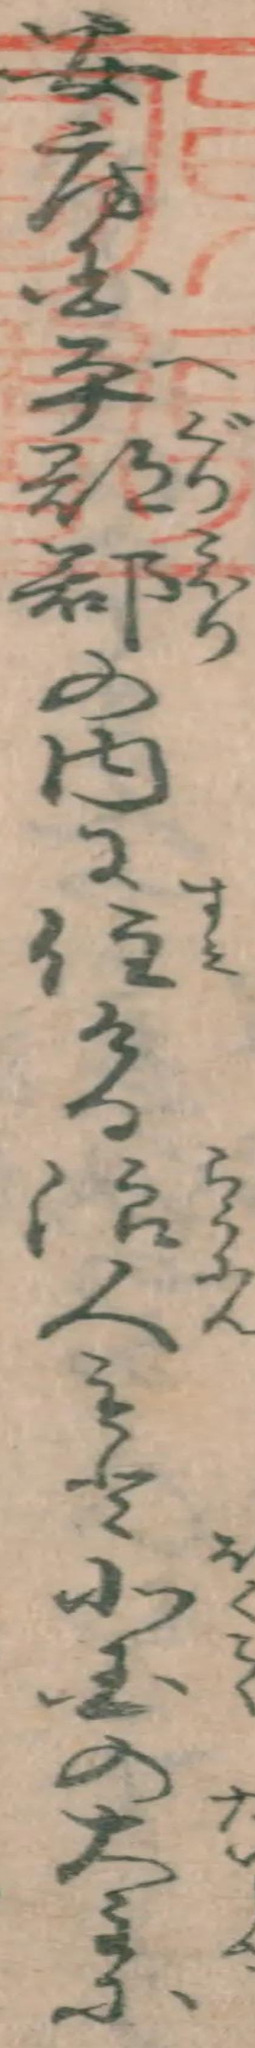安房国平群郡の内に住ける浪人もと北国の大主に
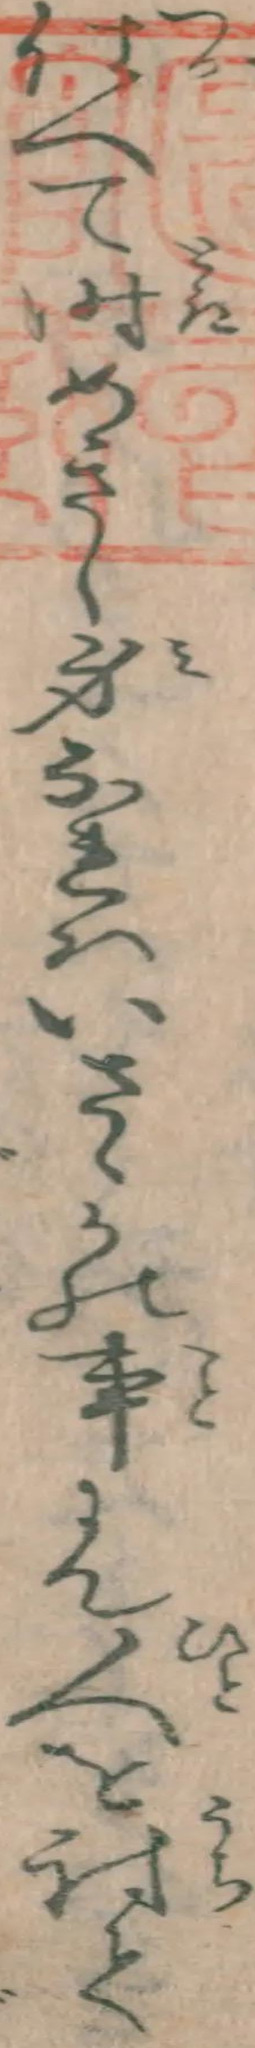仕へて時めきし身なれはいさゝかの事にて人を討て
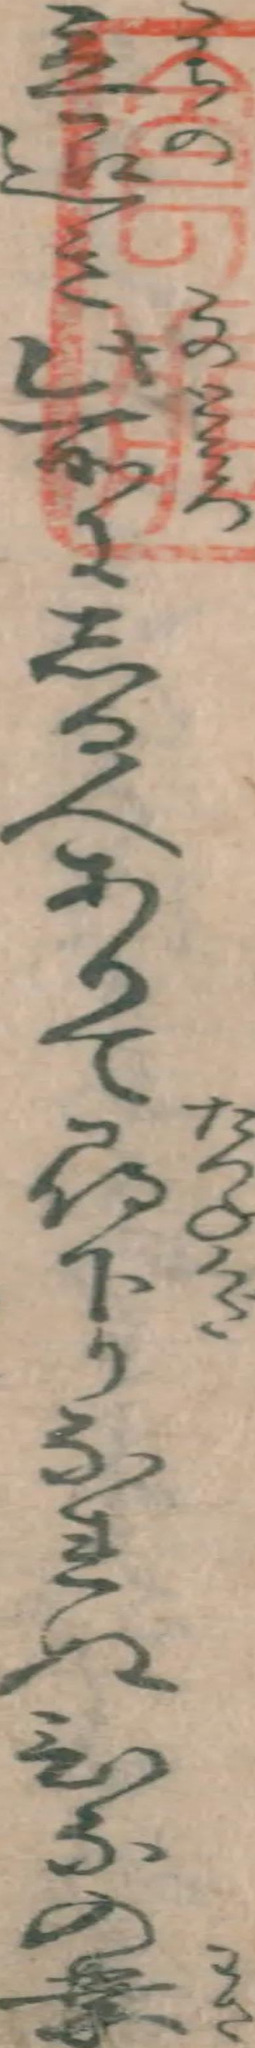立退き此所にしる人ありて尋下りなれぬひなの業
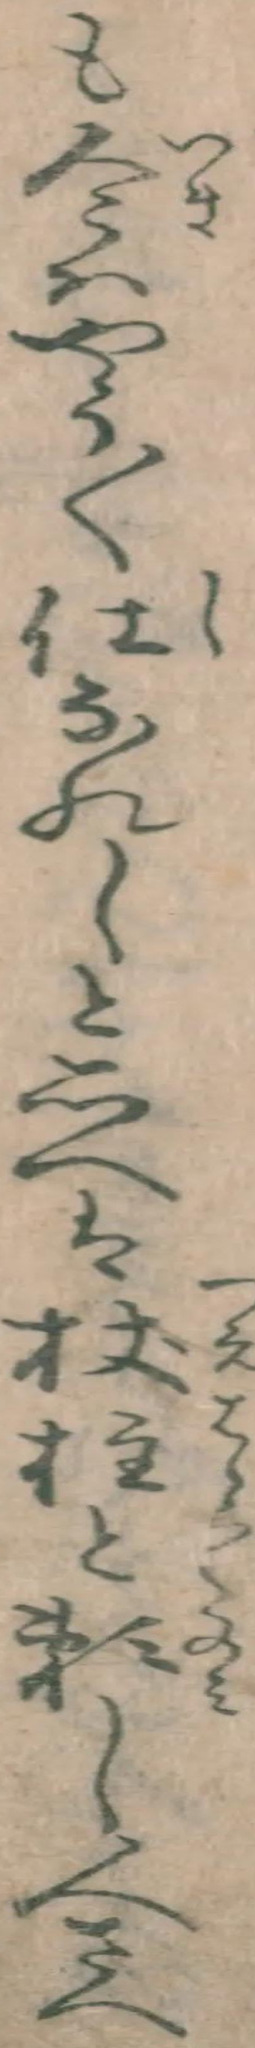も今はやう〳〵仕なれしと思へは杖柱と頼し人さへ
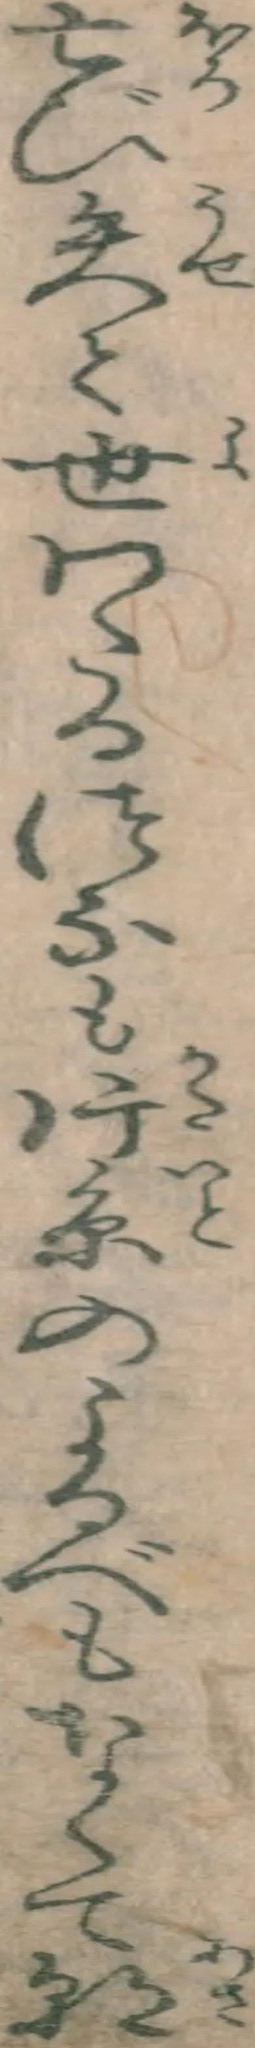亡び失て世わたるつなも片糸のよるべもなくて朝
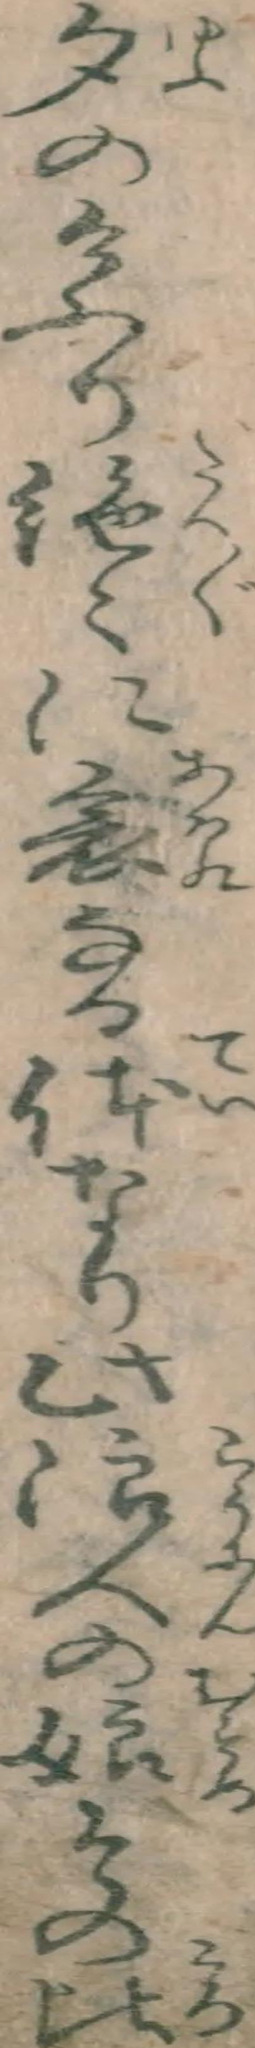夕のけふり絶々に哀なる体なり此浪人の娘その頃
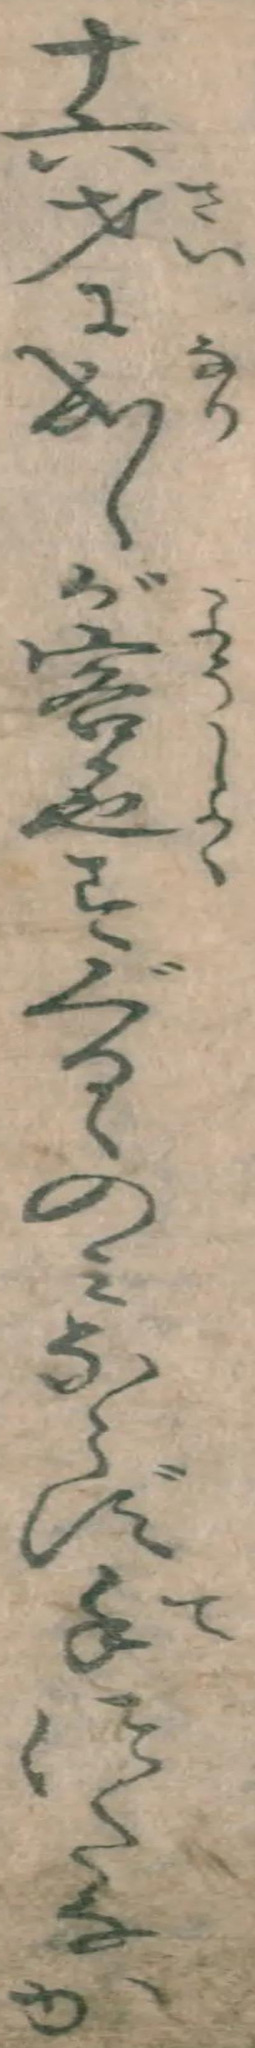十六才に成しが容色すぐるゝのみならず手つたなか
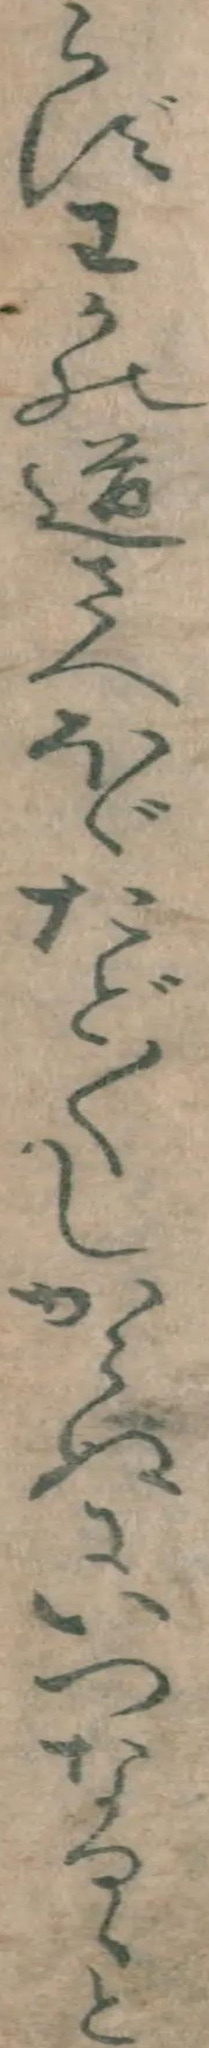らずわかの道さへほゞたど〳〵しからぬにいつなるゝと

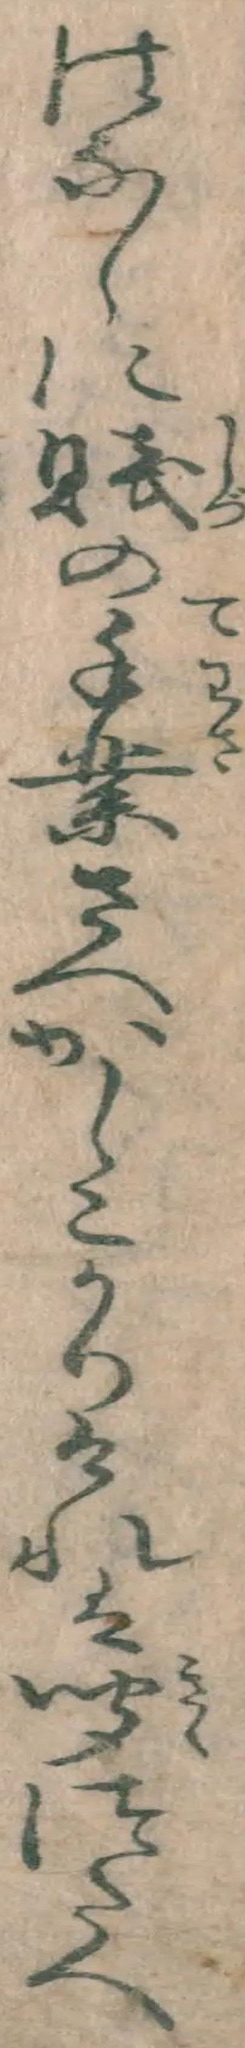はなしに賎の手業さへかしこかりけれは聞つたへ
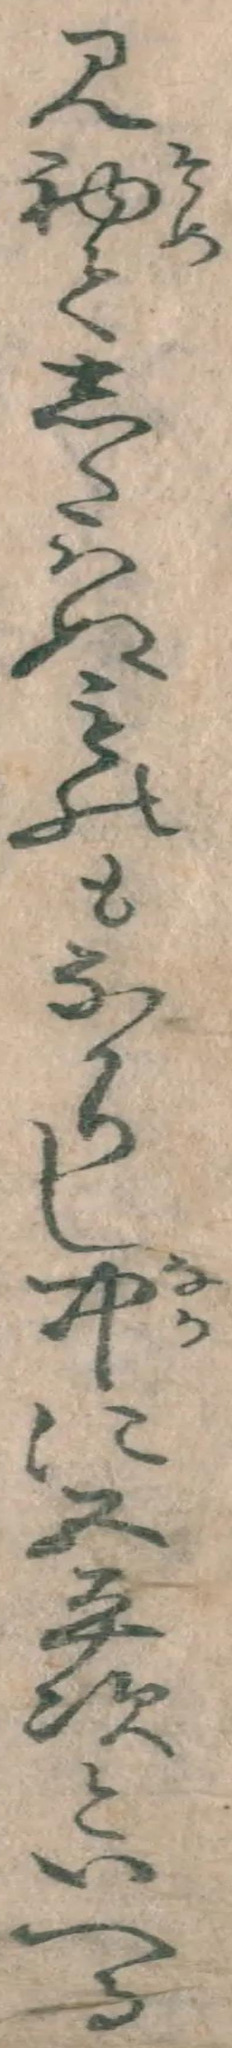見初てしたはぬものもなかりし中に五平次といへる
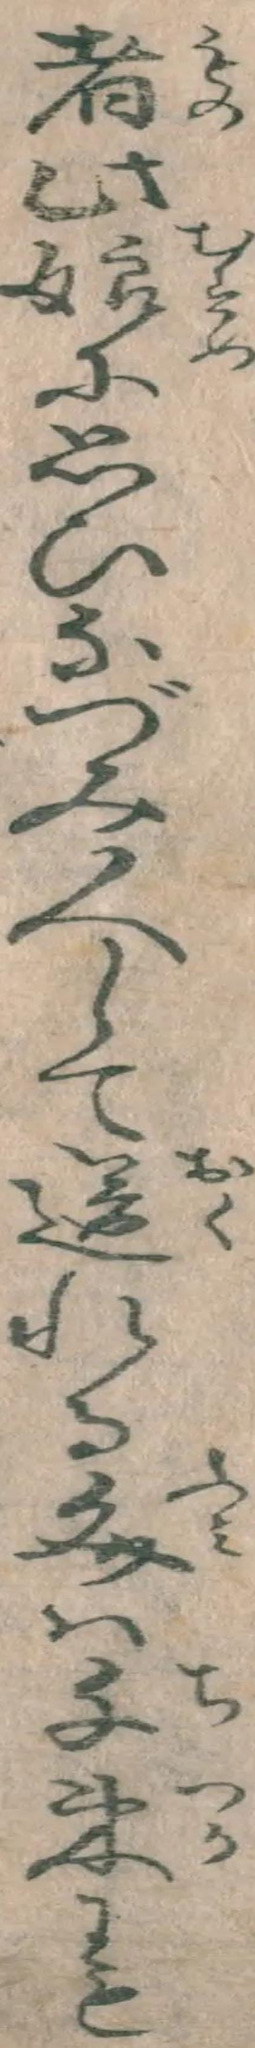者此娘に思ひなづみ人して送れる文は千束にも
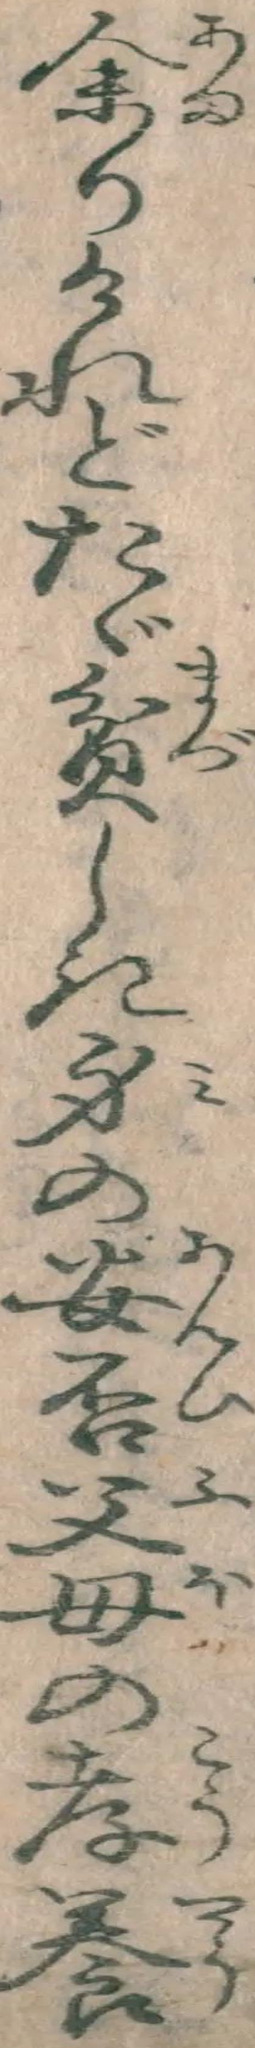余りけれどたゞ貧しき身の安否父母の孝養
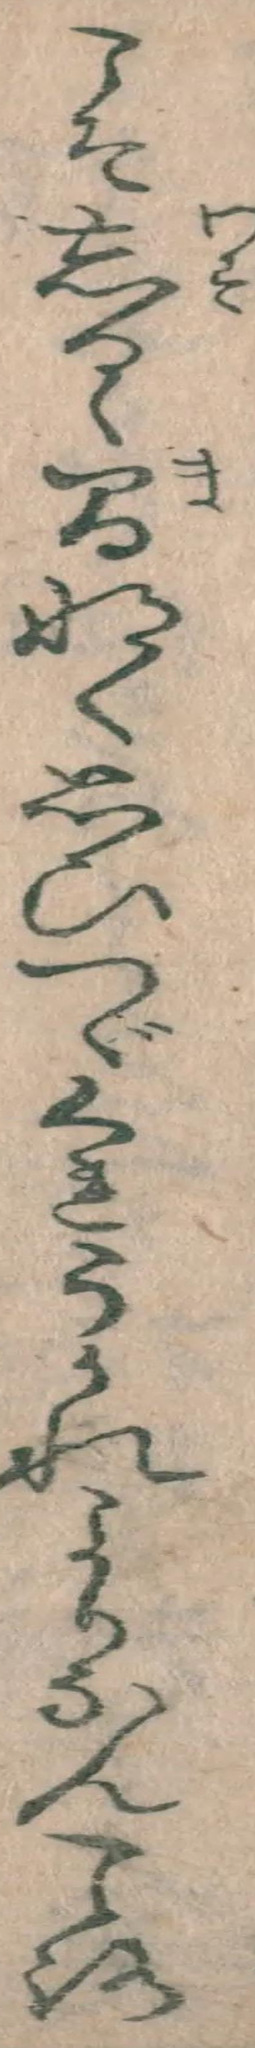こそ忘るゝ間なく思ひつゞられうかれよりなんころ
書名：怪談御伽童 5巻. [2]
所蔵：国立国会図書館 National Diet Library, JAPAN
